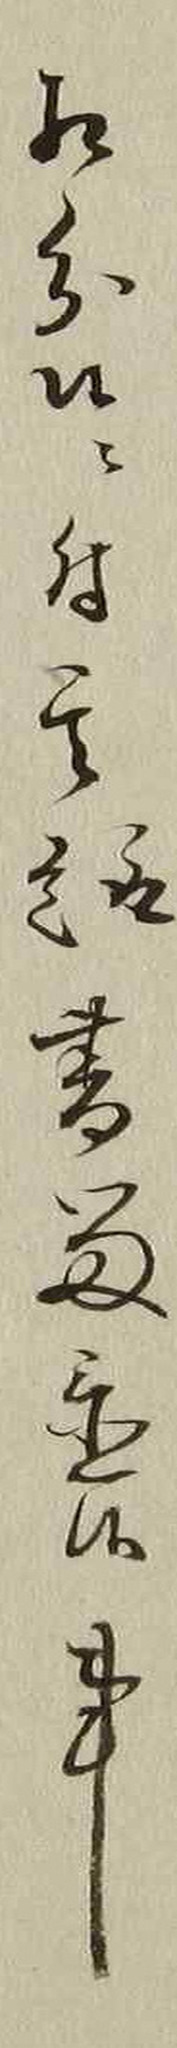相分候ニ付其趣書留置候事
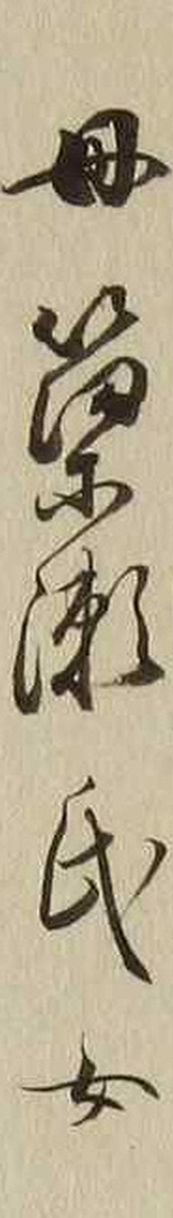母簗瀬氏女
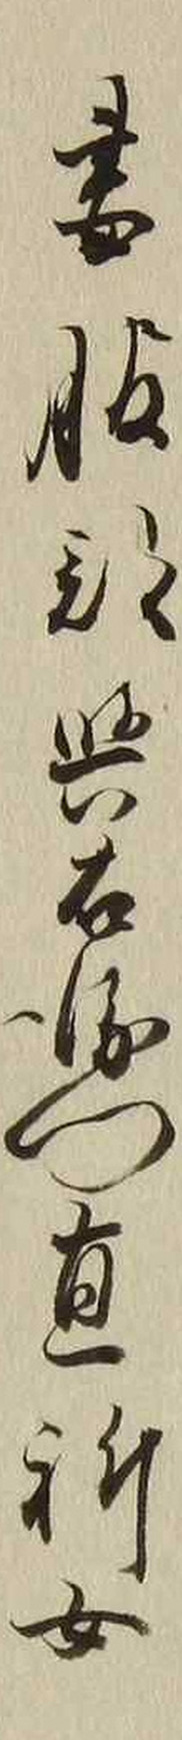妻服部与右衛門直祈女
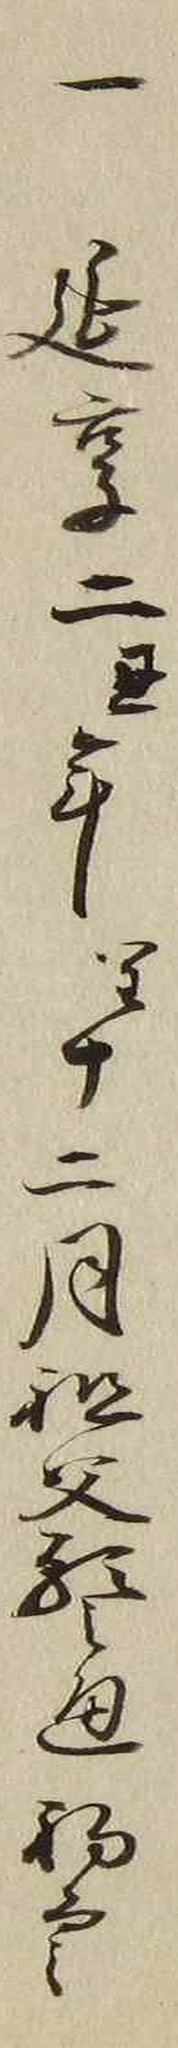一延享二丑年閏十二月祖父願之通初而之
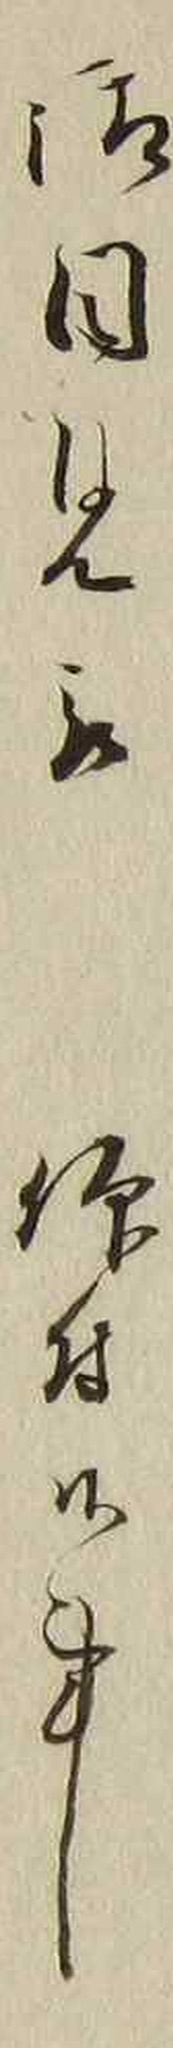御目見被仰付候事
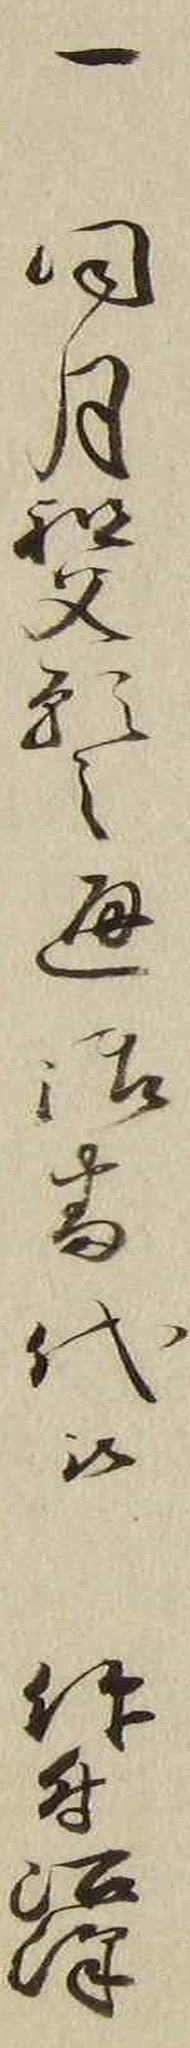一同月祖父願之通御番代被仰付沼沢
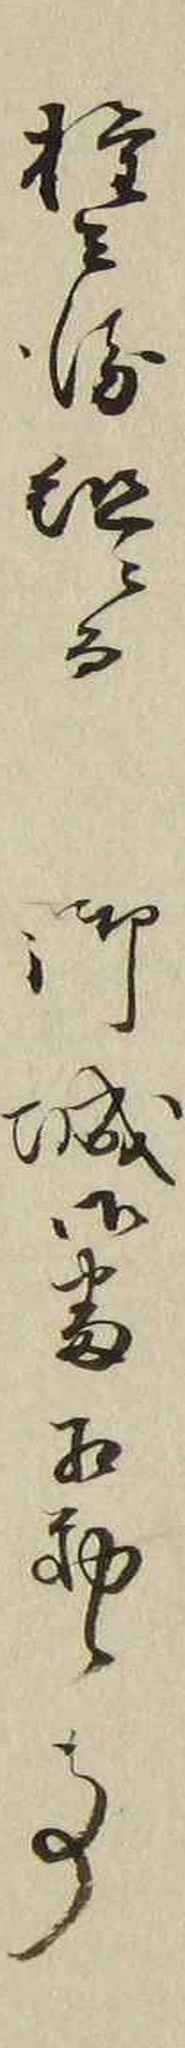権兵衛組ニ而御城御番相勤候事

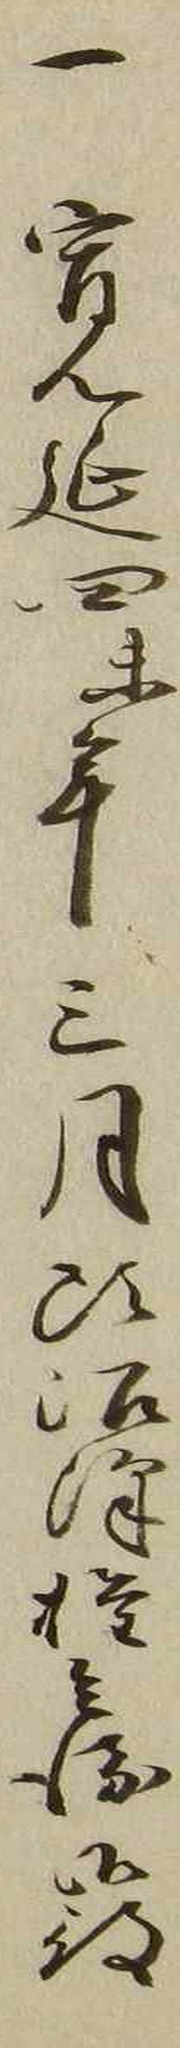一寛延四未年三月頭沼沢権兵衛御役
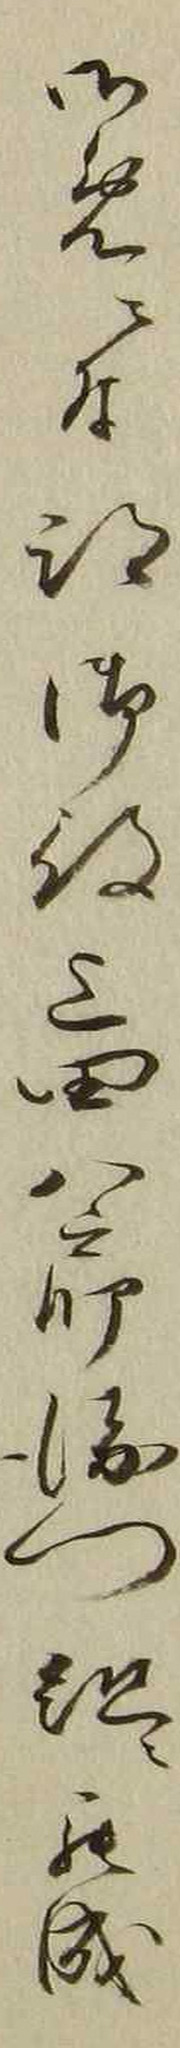御免ニ付跡御役上田八郎衛門組ニ罷成
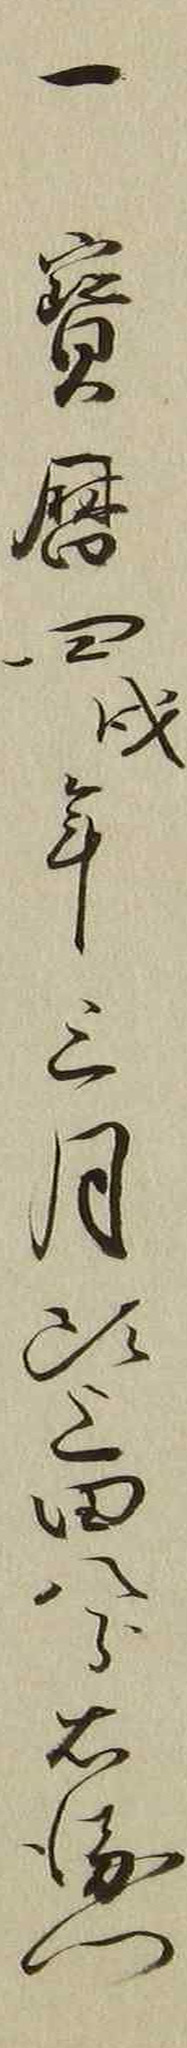一宝暦四戌年三月頭上田八郎右衛門
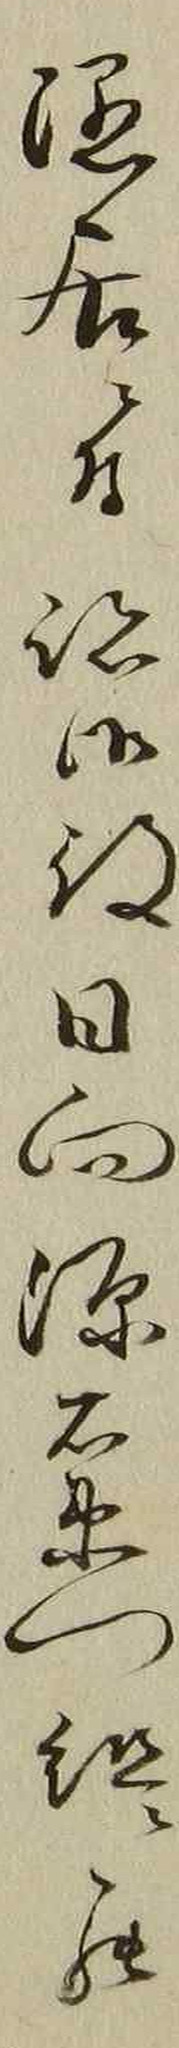隠居ニ付跡御役日向源右衛門組ニ罷
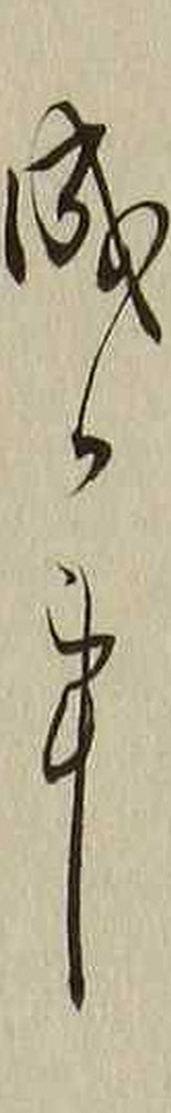成候事
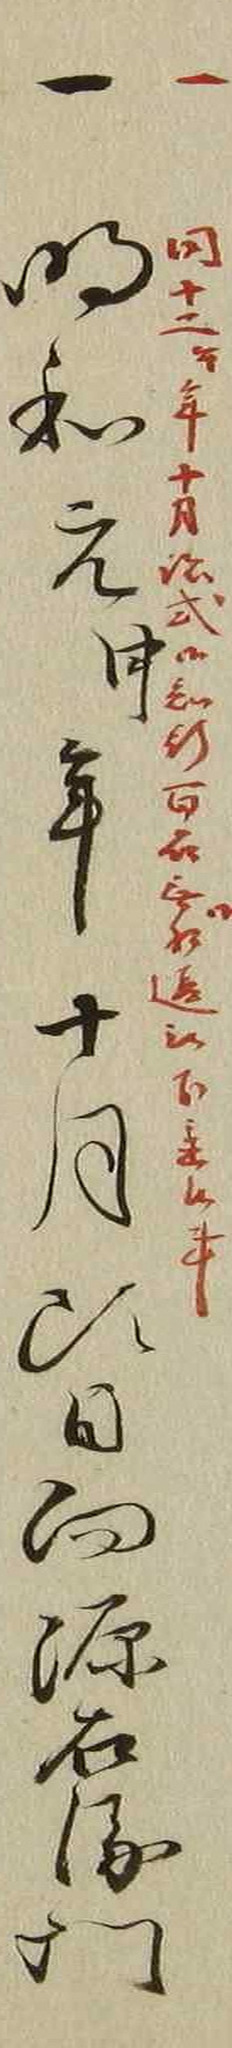一明和元申年十月頭日向源右衛門
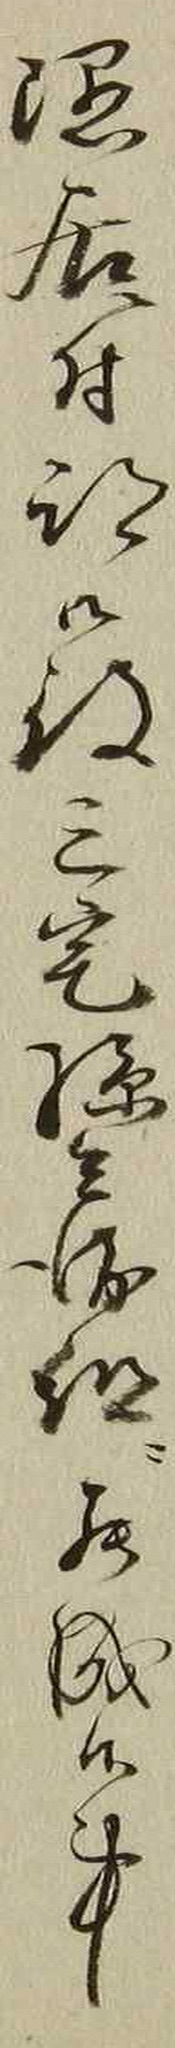隠居ニ付跡御役三宅孫兵衛組ニ罷成候事
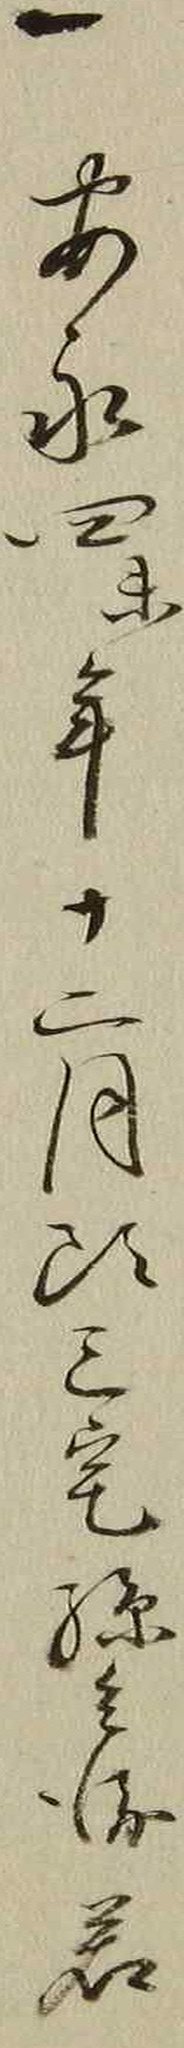一安永四未年十二月頭三宅孫兵衛若
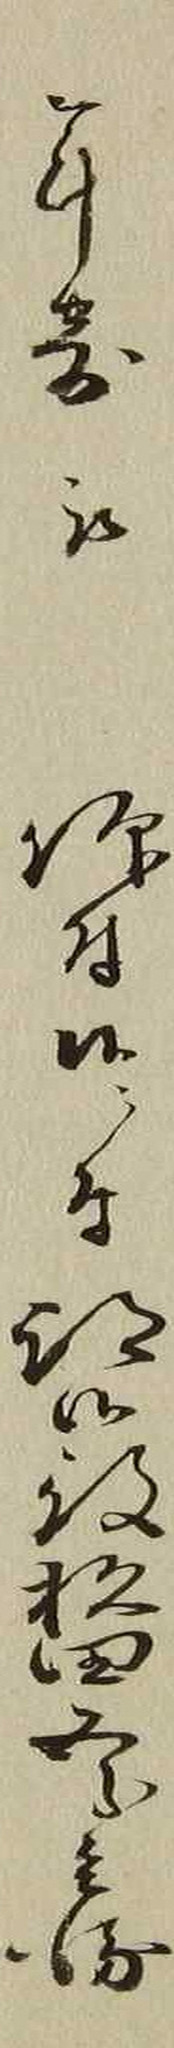年寄被仰付候ニ付跡御役杉田五郎兵衛
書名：諸士系譜　巻之26　い之部26
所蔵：会津若松市立会津図書館
